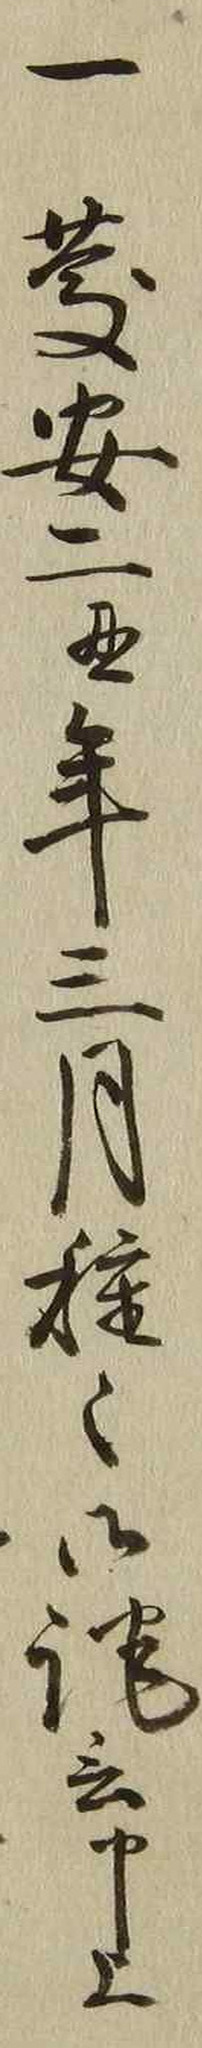一慶安二丑年三月種々御詫言申上
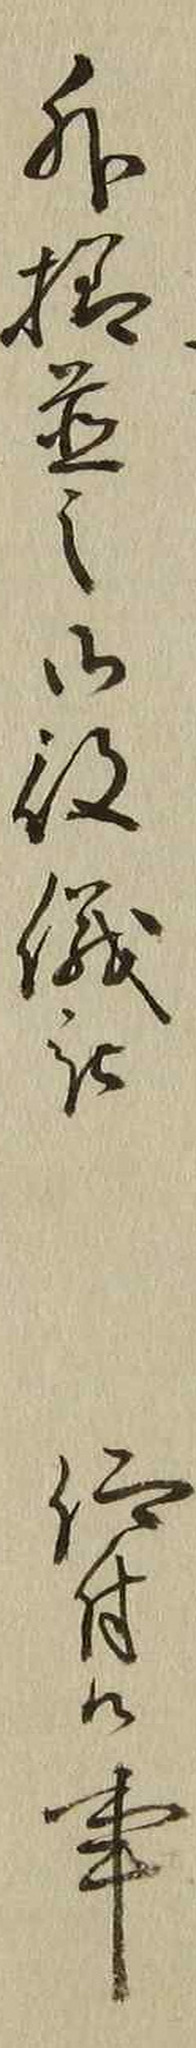外様並之御役儀被仰付候事
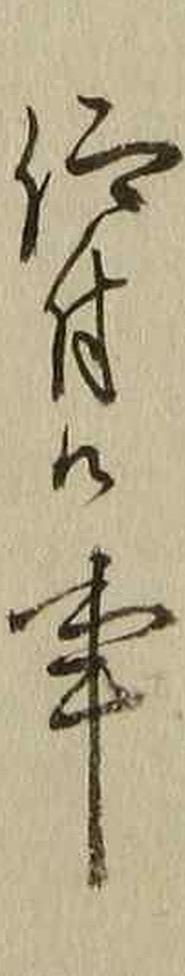仰付候事
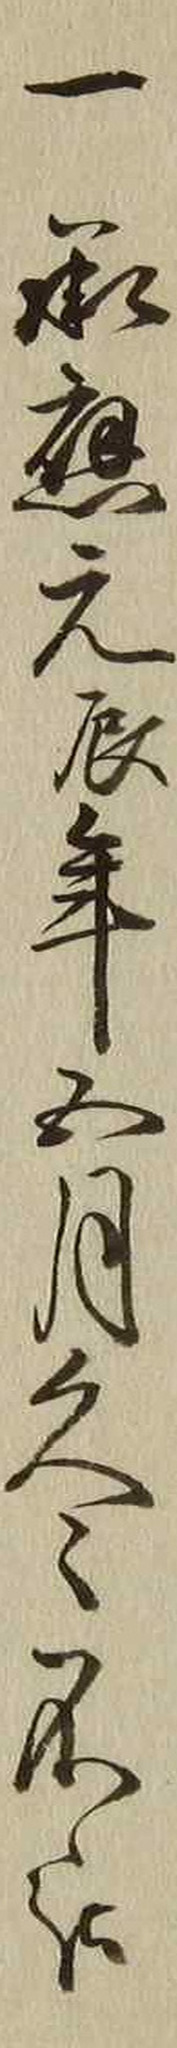一承応元辰年五月久々不被
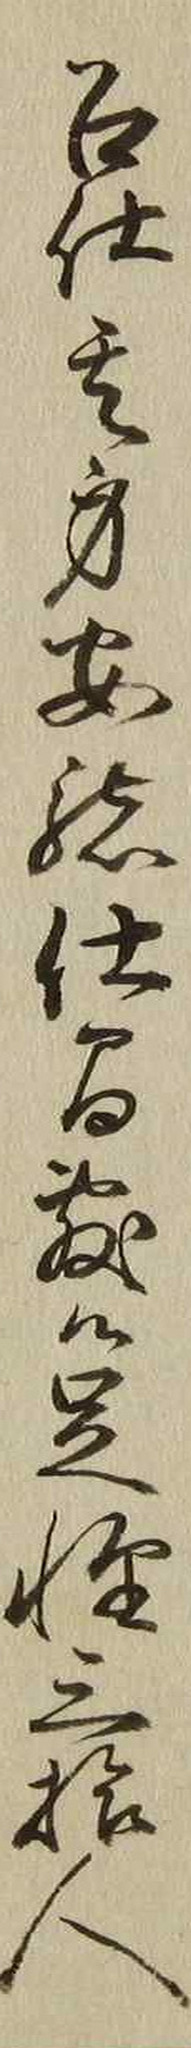召仕其身安緒仕間敷候足軽三拾人
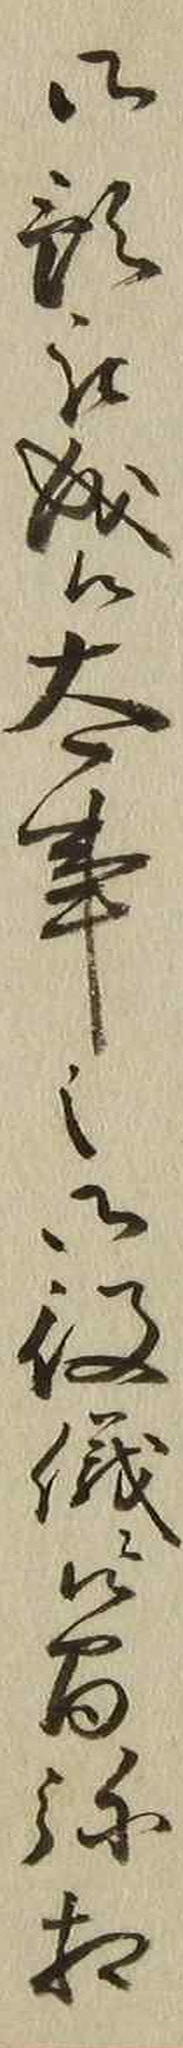御預被成候太事之御役儀ニ候間弥相
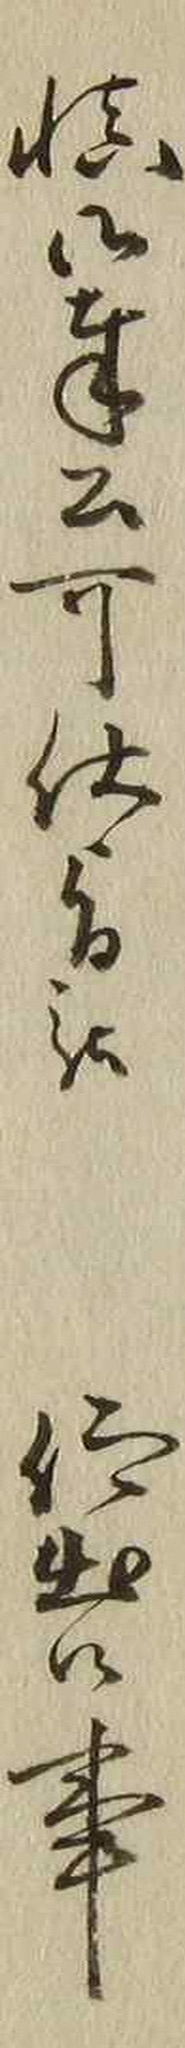慎御奉公可仕旨被仰出候事
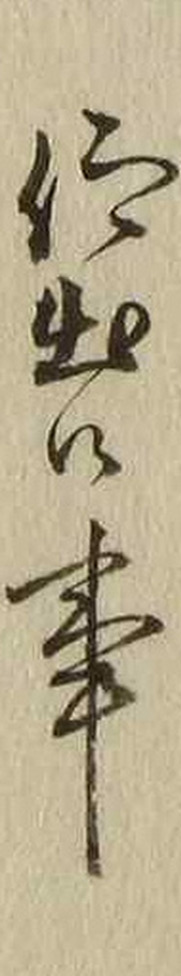仰付候事
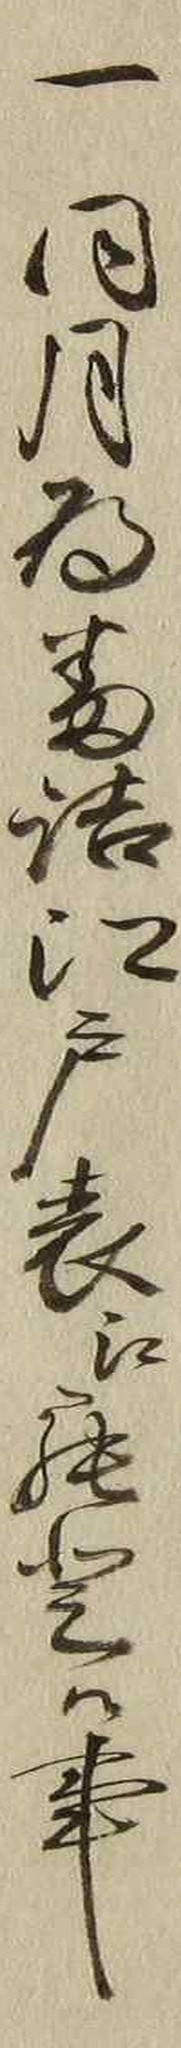一同月為番詰江戸表江罷登候事
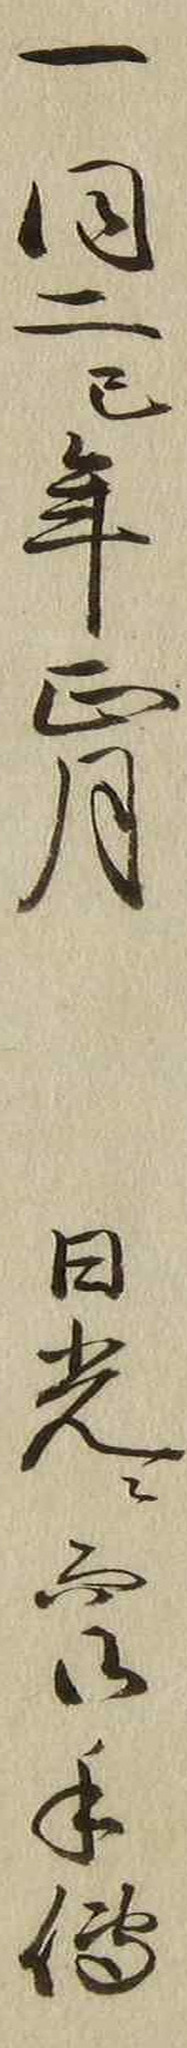一同二巳年正月日光ニ而御手伝
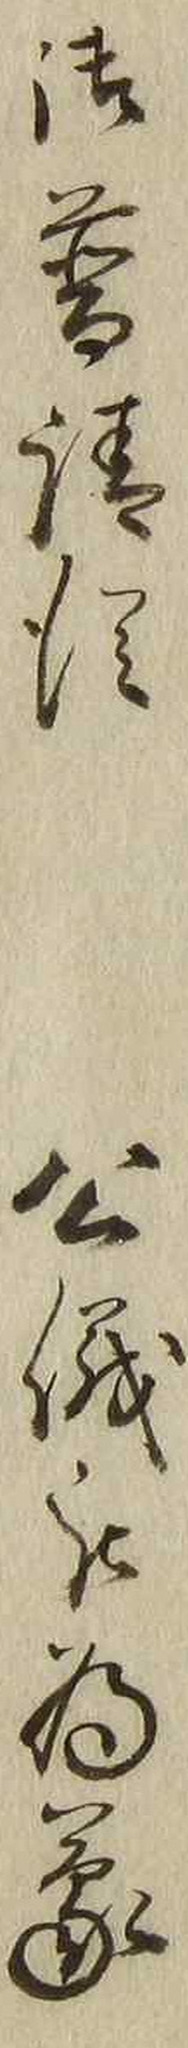御普請従公儀被為蒙
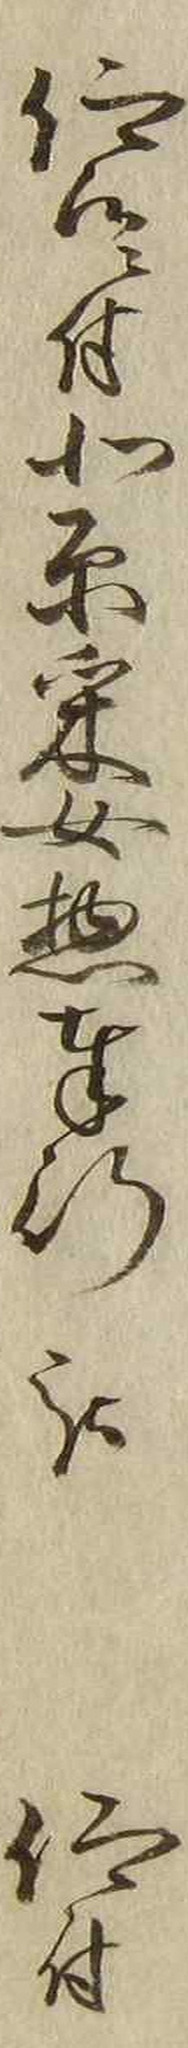仰候ニ付北原采女惣奉行被仰付
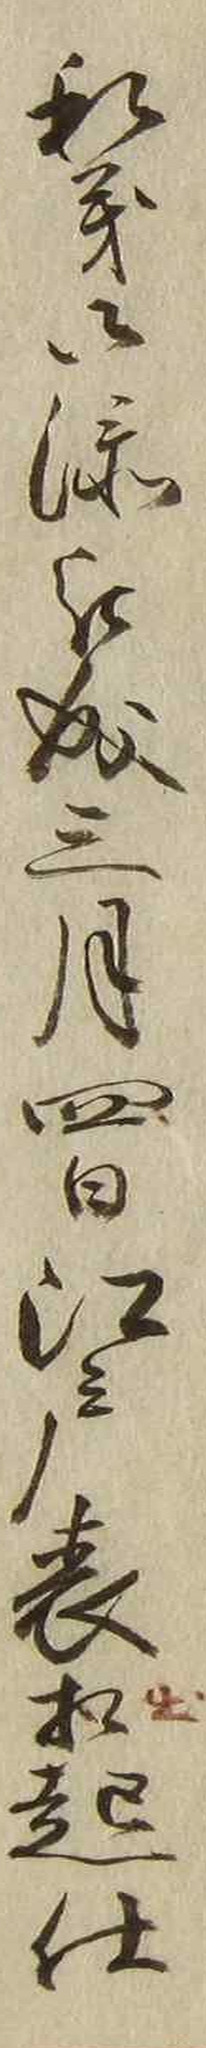私義御添被成三月四日江戸表出起仕
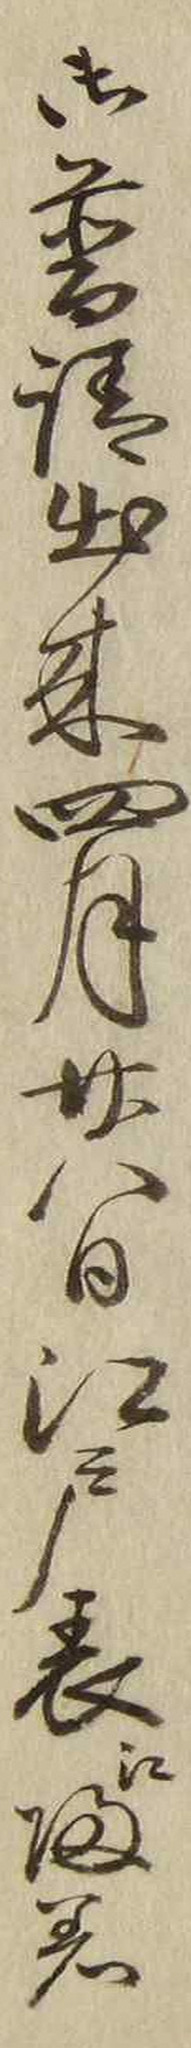御普請出来四月廿八日江戸表江帰着

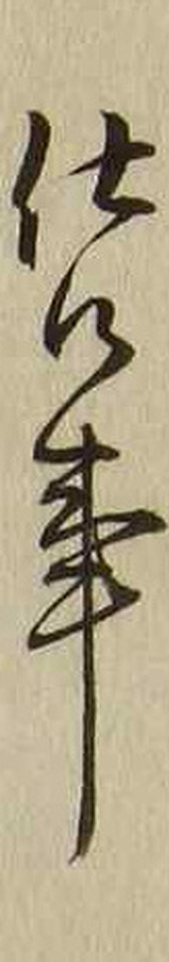仕候事
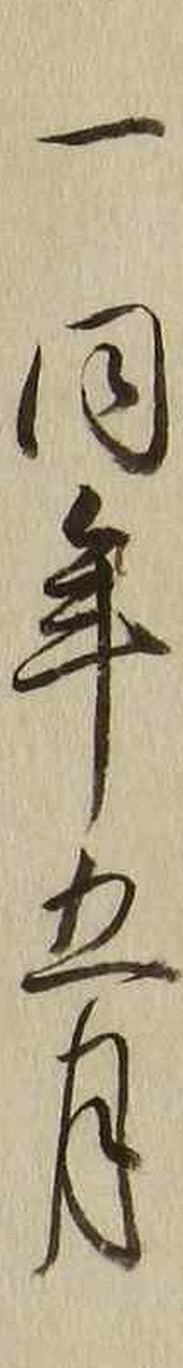一同年七月
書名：諸士系譜　巻之60　と之部3
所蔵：会津若松市立会津図書館
